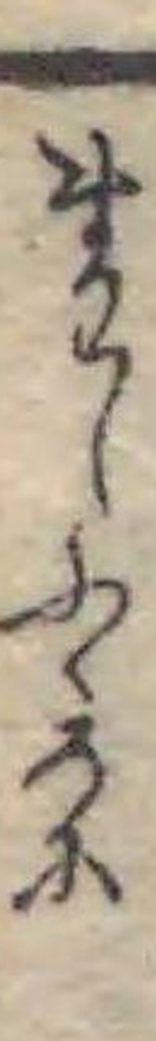まわしふくろに
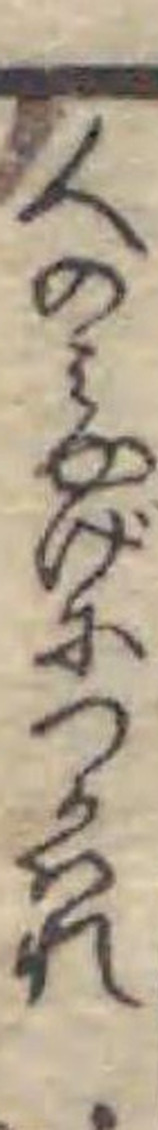人のみやげにつかはれ
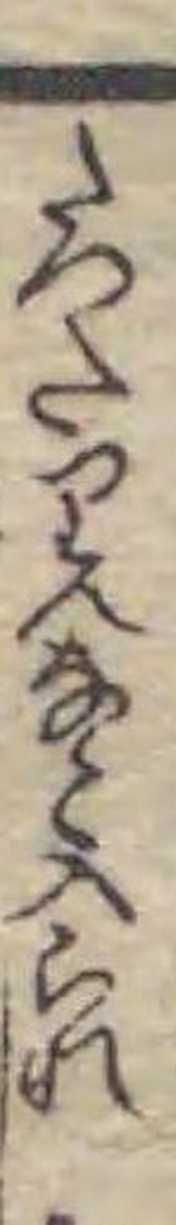たつたりんなと入られ
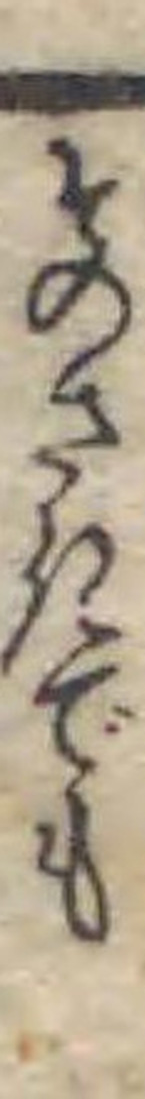そのさきでも
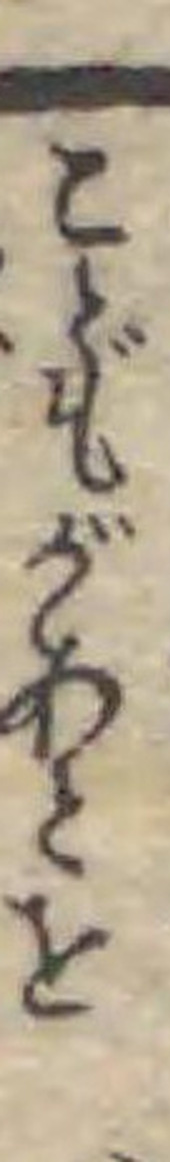こどもがあとを
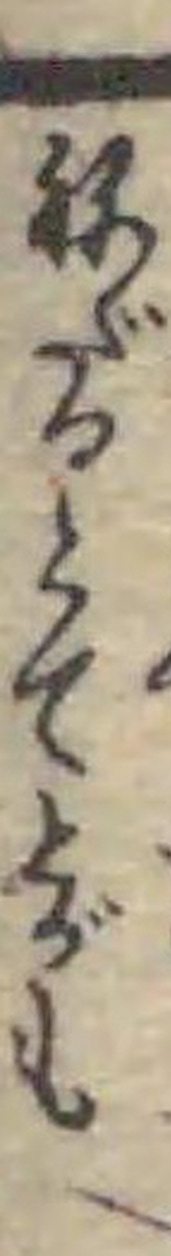ねだるとてとがも
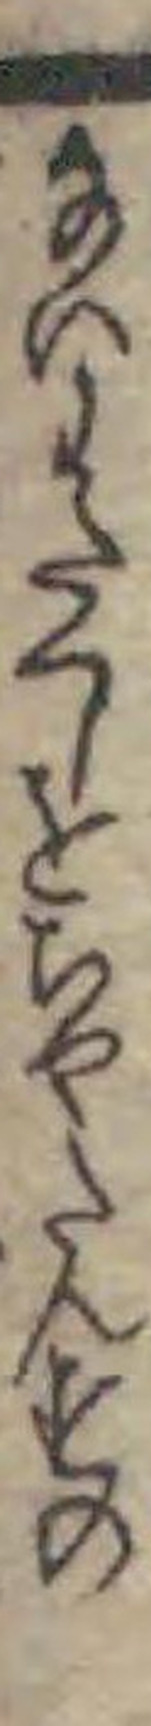ないわたくしをちやたんすの
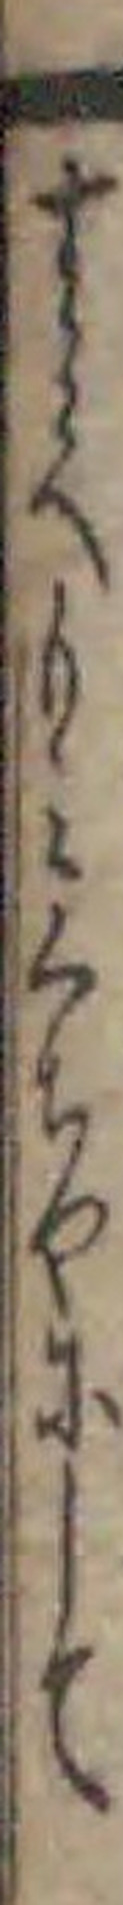すみへもみくちやにして
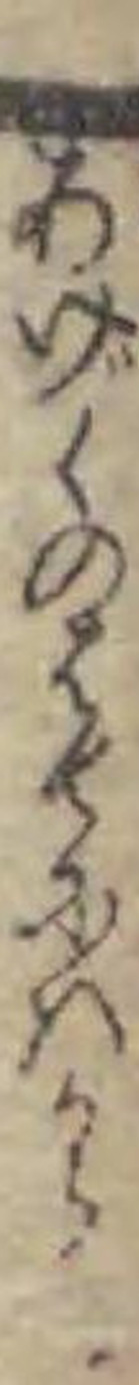あげくのはてにはから
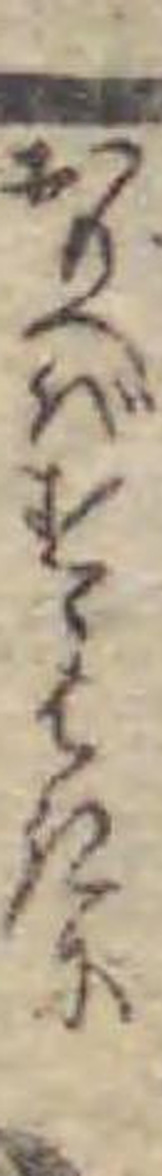おもへばすゝはきに
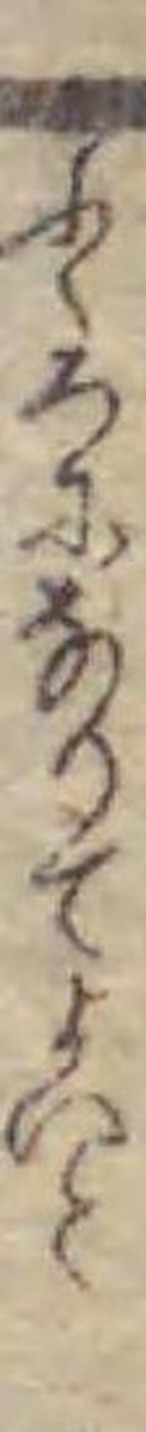ふくろになりてよいと
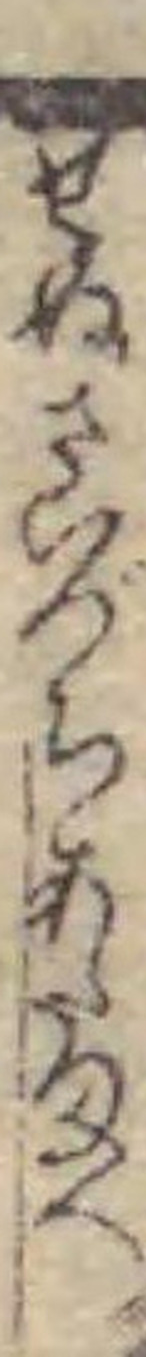せぬさいづちあたまへ
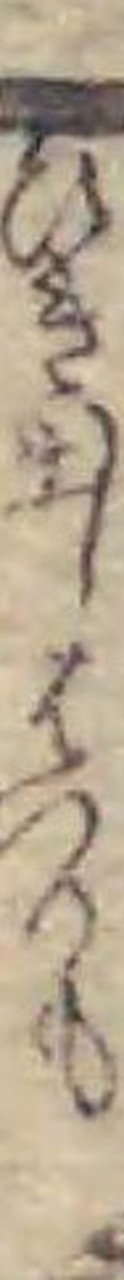ひき出しはいりも
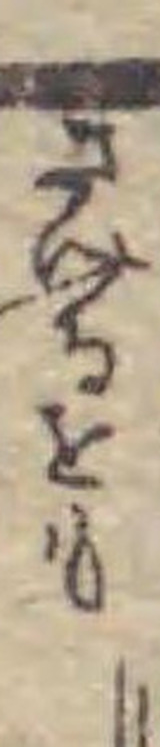さけるをも
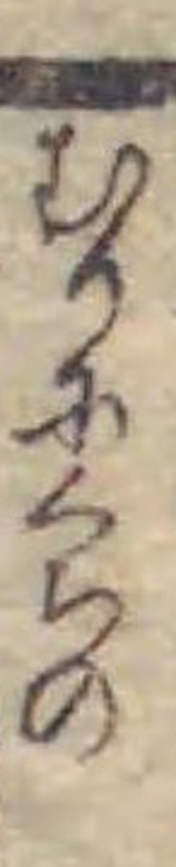むりにくちの
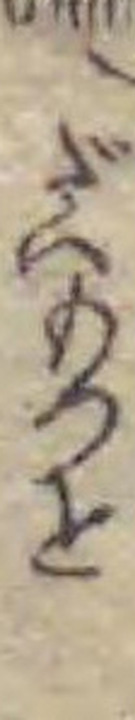だいもつを
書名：紙屑身上噺 : 3巻
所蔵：国立国会図書館 National Diet Library, JAPAN
